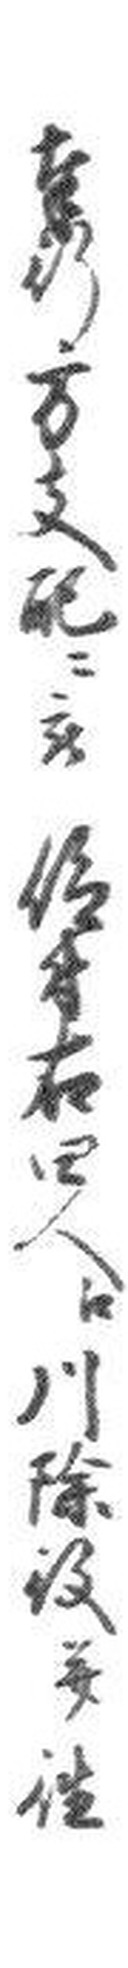奉行方支配ニ付被仰付右四人江川除役并往
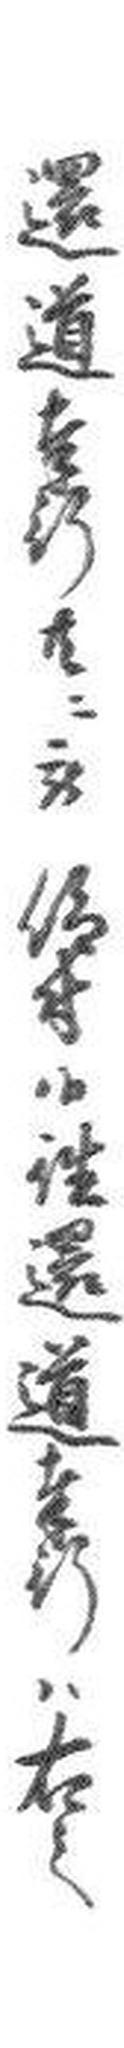還道奉行共ニ被仰付候往還道奉行ハ右之
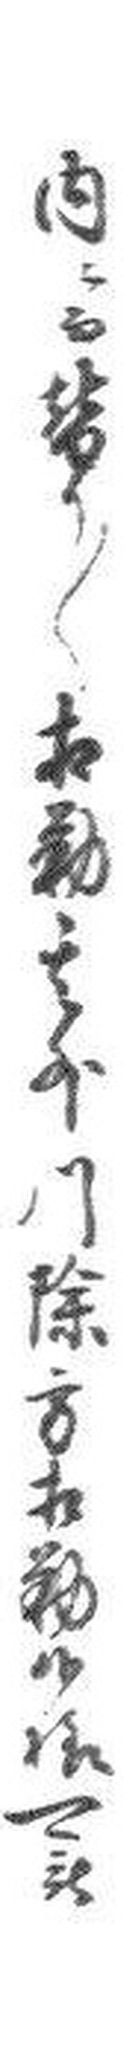内ニ而替り〳〵相勤其外川除方相勤候様可被
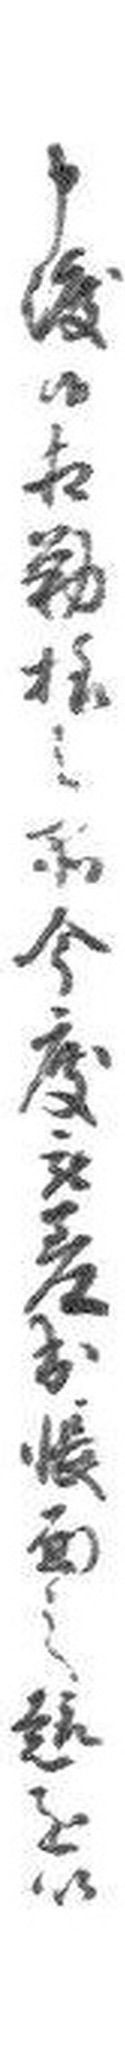申渡候相勤様之品今度被差出帳面之趣を以
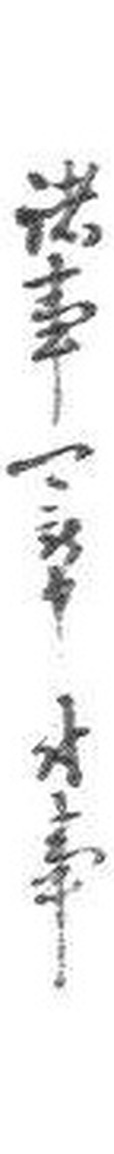諸事可被申付事
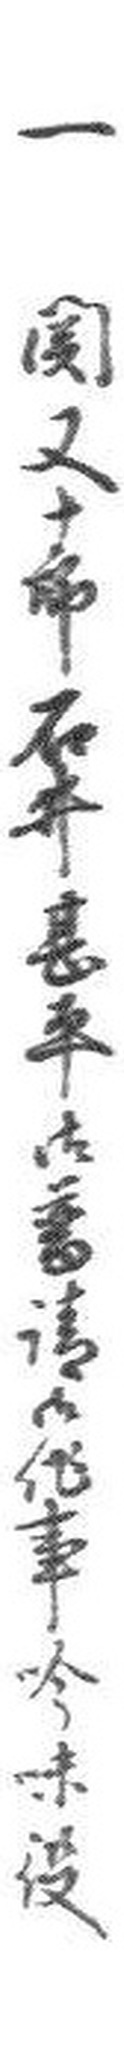一関又十郎石井甚平御普請御作事吟味役

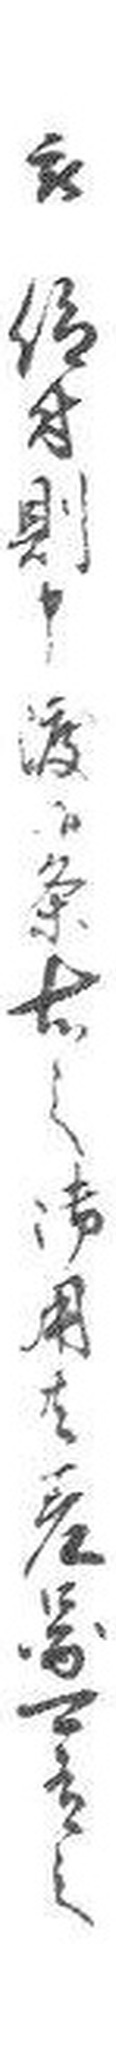被仰付則申渡候条右之御用共差図可有之
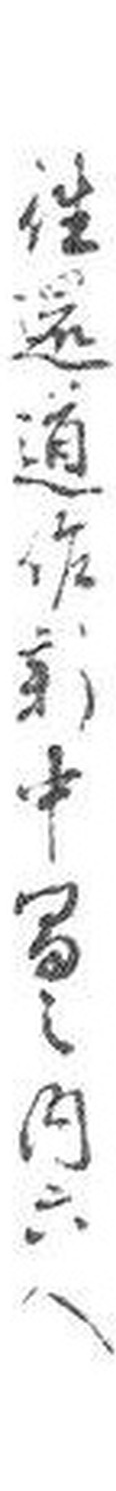往還道佐新中間之内六人
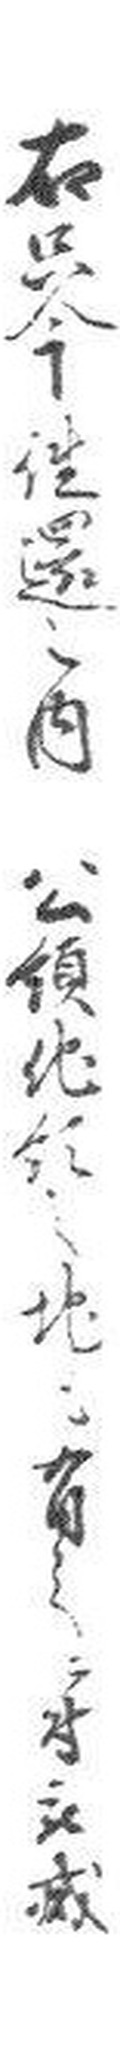右只今往還之内公領他領之地も有之ニ付被減
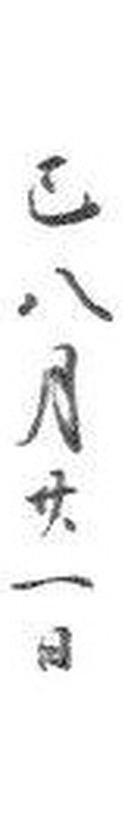巳八月廿一日
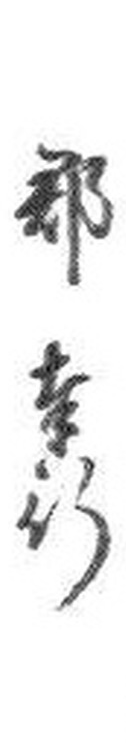郡奉行
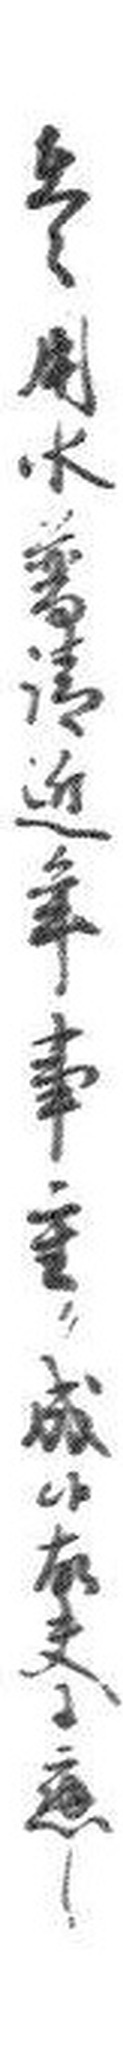在々用水普請近年事重ク成候故夫に応し
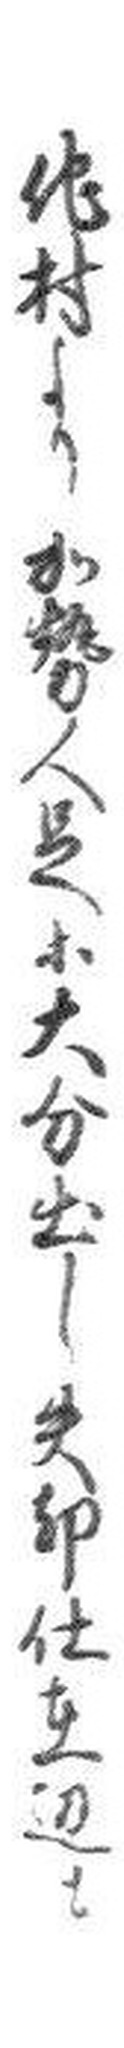他村より加勢人足等大分出し失却仕在辺も
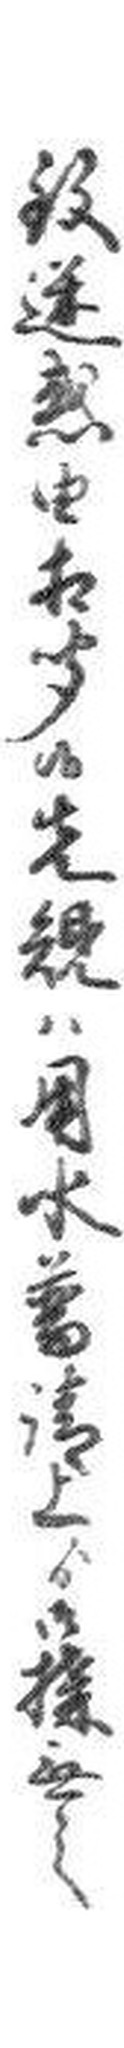致迷惑由相聞候先規ハ用水普請上ゟ御構無之
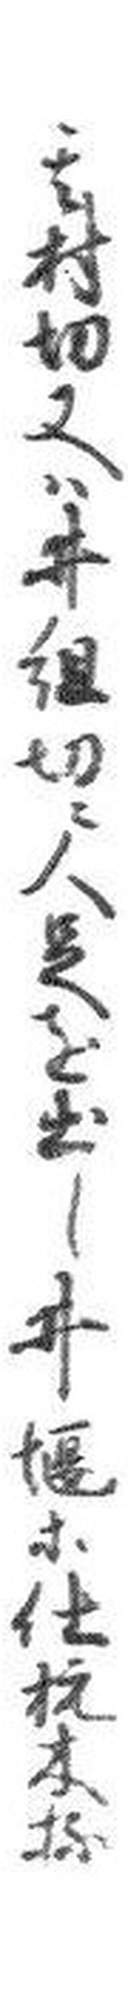其村切又ハ井組切ニ人足を出し井堰等仕杭木抔
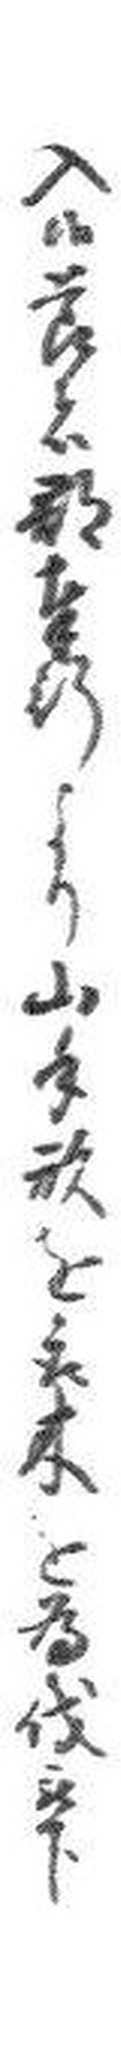入候節者郡奉行より山手形を取木を為伐被下
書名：家譜 二十九 吉邦公 従正徳二年到正徳三年
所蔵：福井県文書館 Fukui Prefectural Archives
